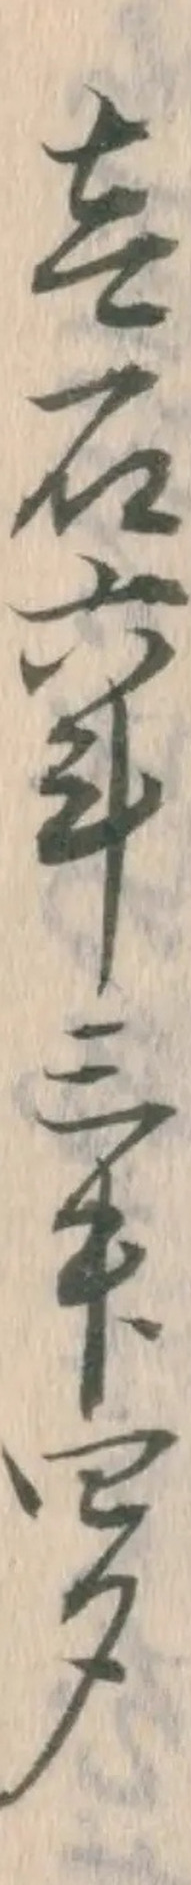壱石六斗三升四勺
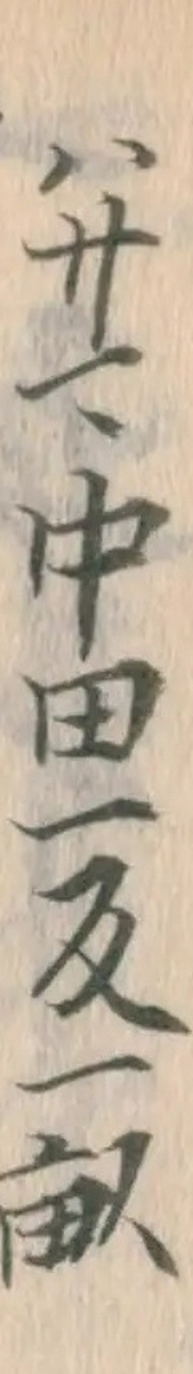ハサマ中田一反一畝
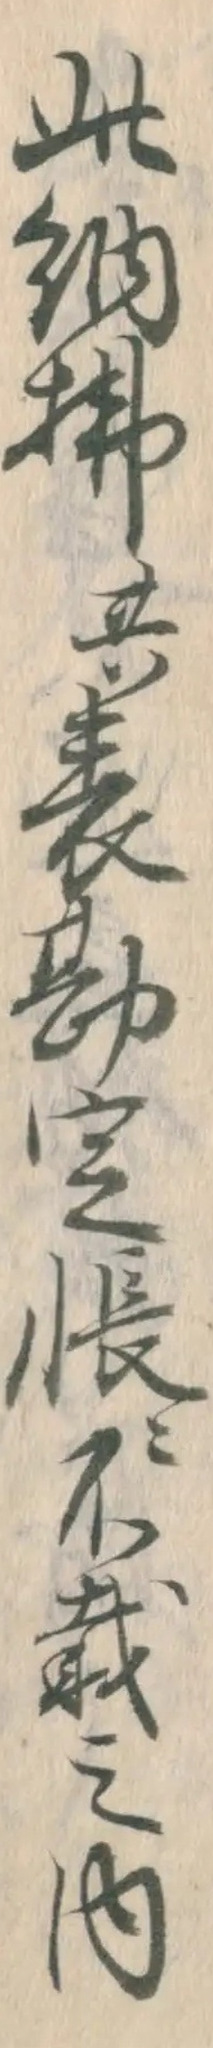此納払共表勘定帳に不載之内
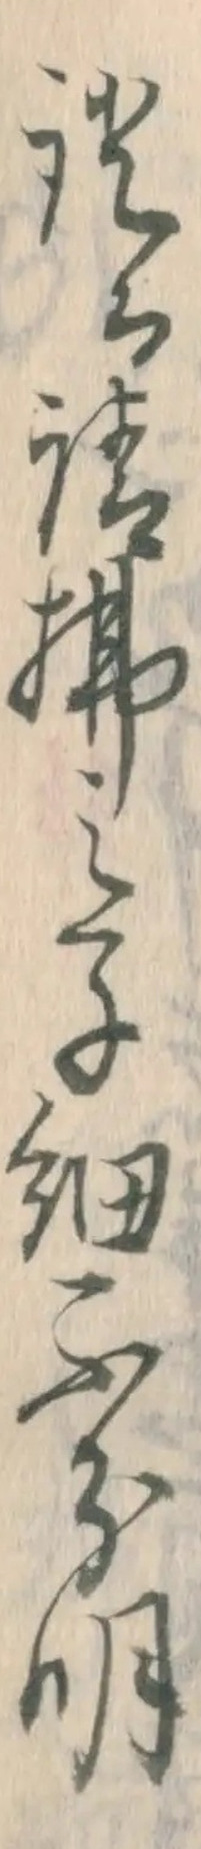証而請払之子細不分明

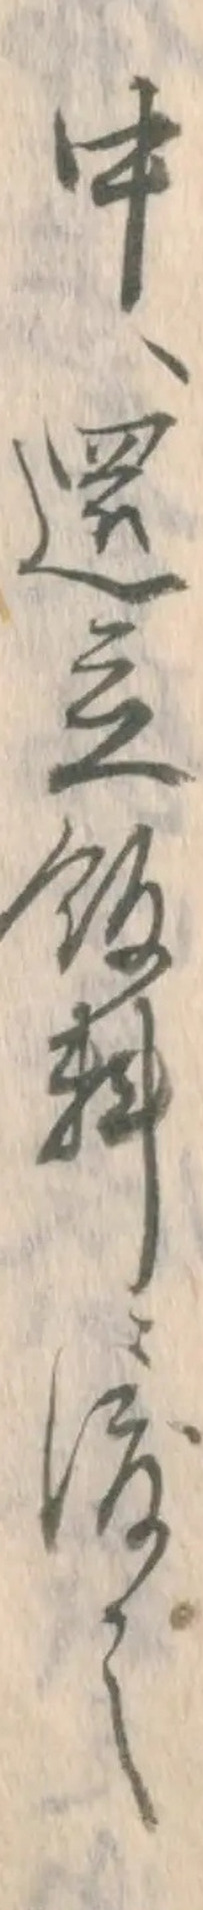中へ還立飯料に渡之
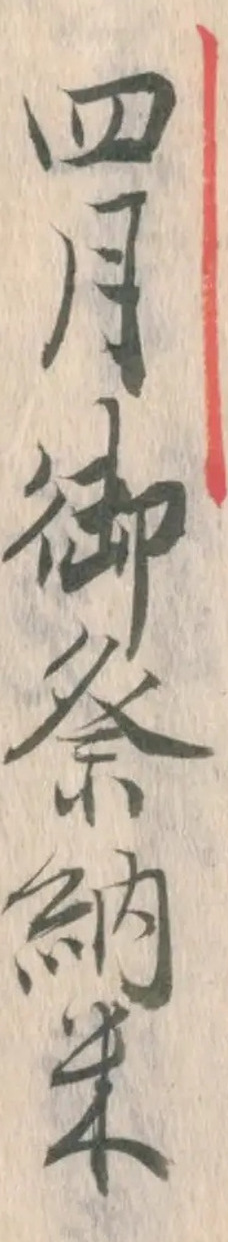四月御祭納米
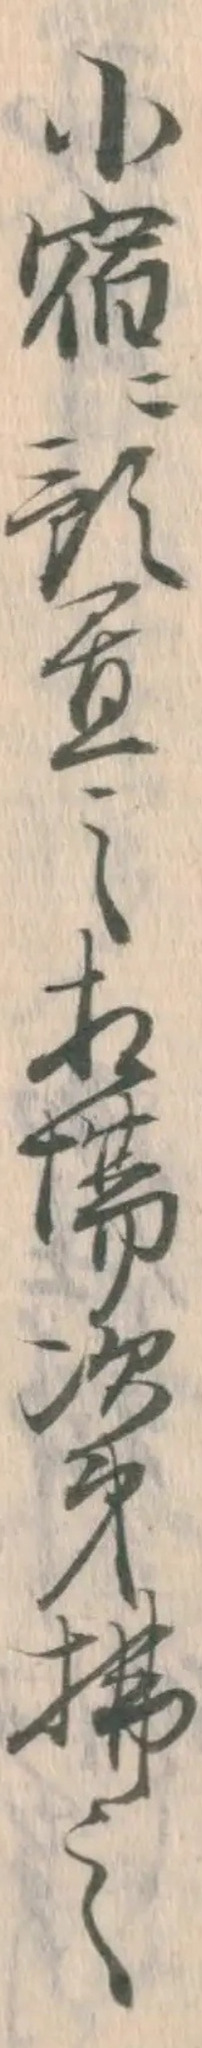小宿に預置之相場次第払之

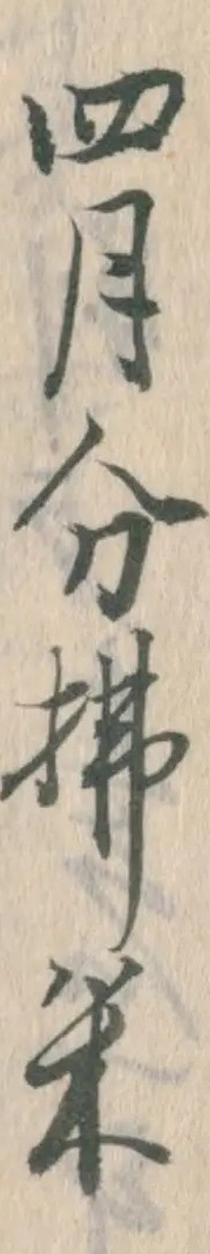四月分払米
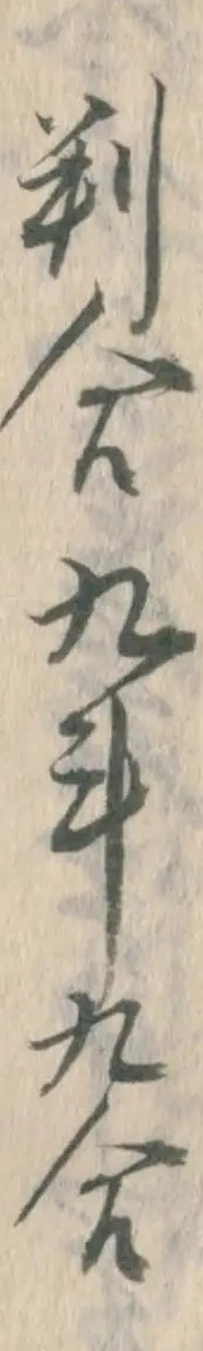判合九斗九合

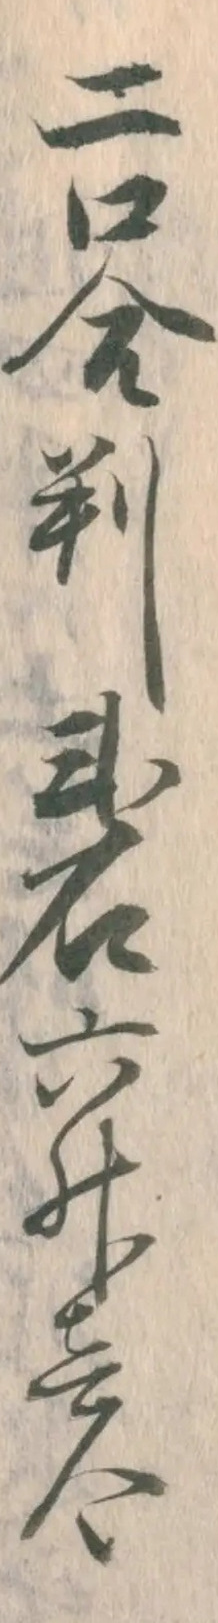二口合判弐石六升壱合
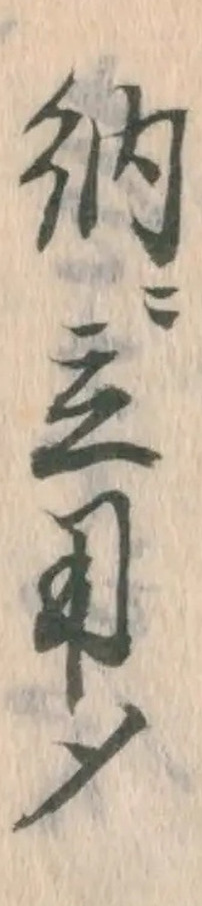納ニ立用〆
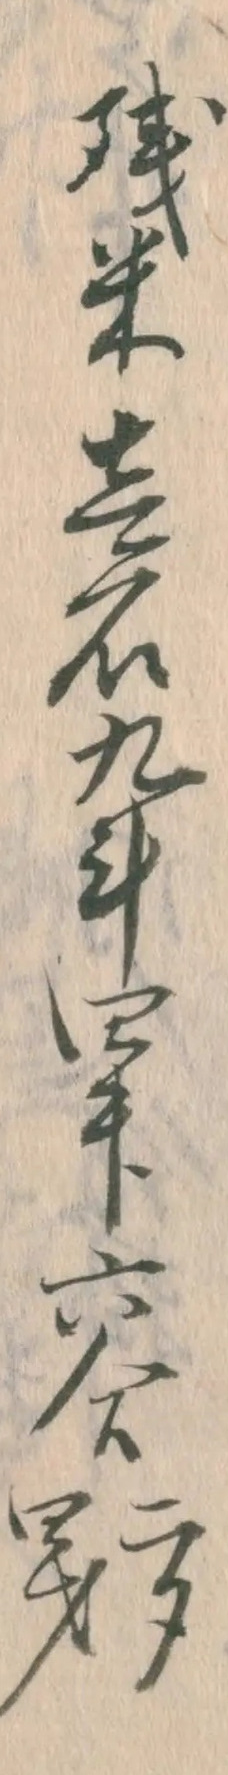残米壱石九斗四升六合弐勺四才
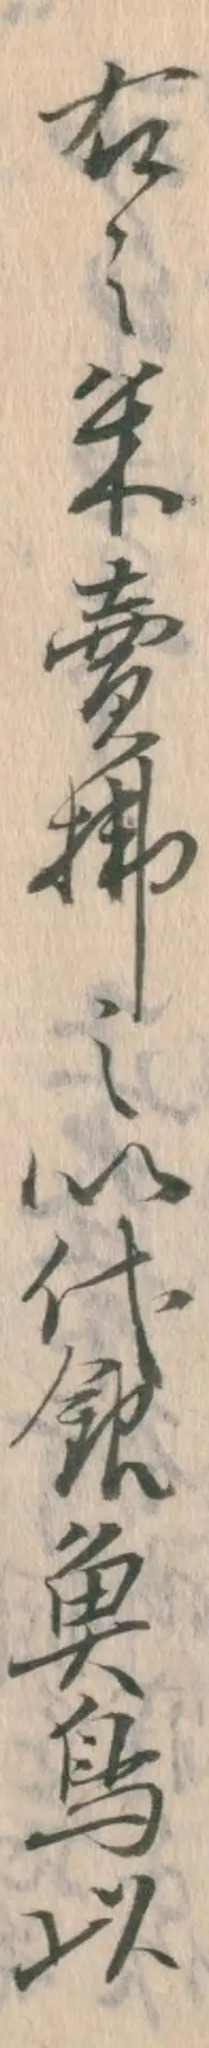右之米売払之以代銀魚鳥以
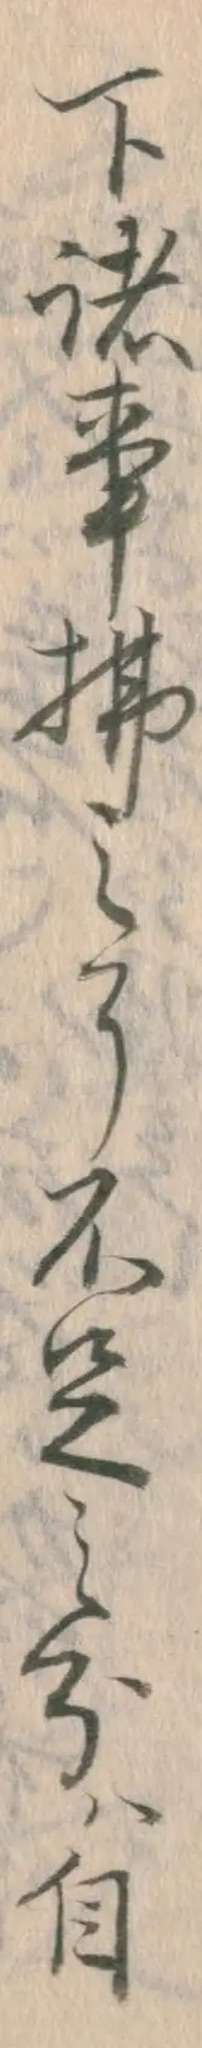下諸事払之了不足之分は自
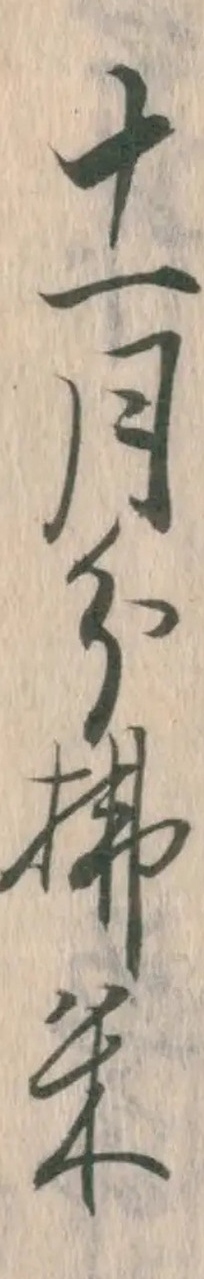十一月分払米
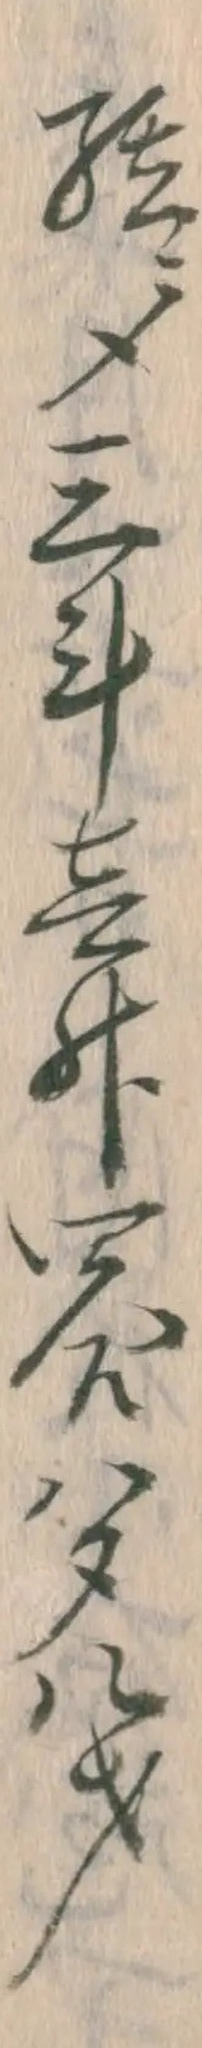弦ニシテ三斗壱升四合八勺八才
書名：賀茂社記録. 第81冊
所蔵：国立国会図書館 National Diet Library, JAPAN
